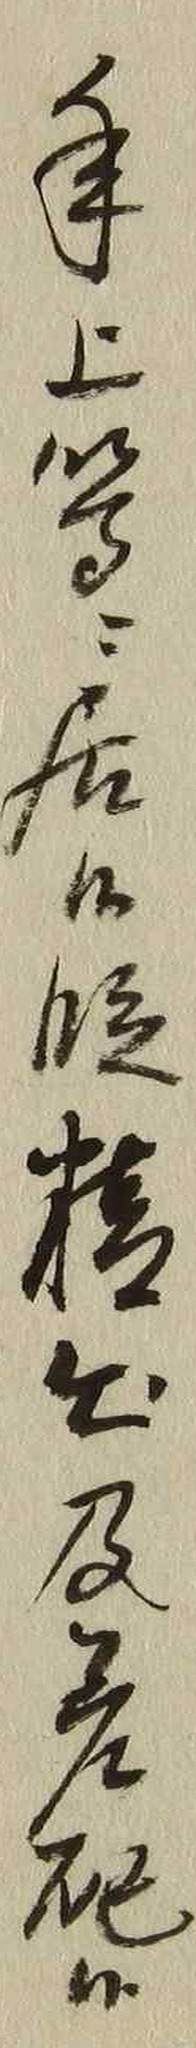年上等ニ居候段精出及差配候
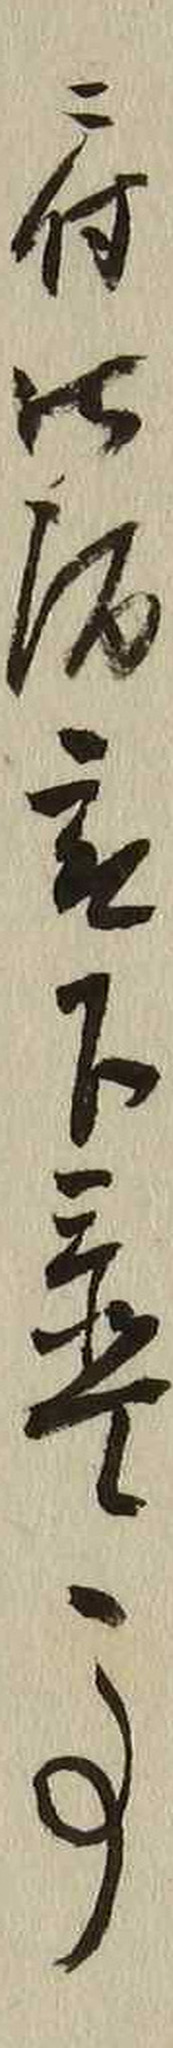ニ付御酒被下置候事
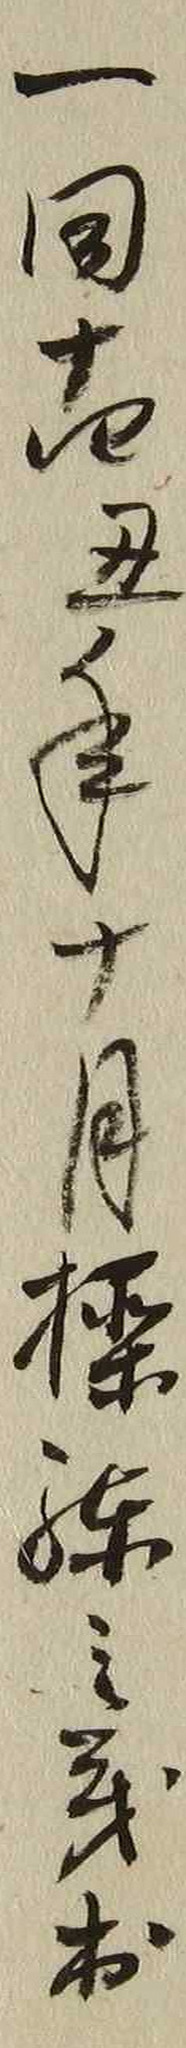一同十四丑年十月操練之義出
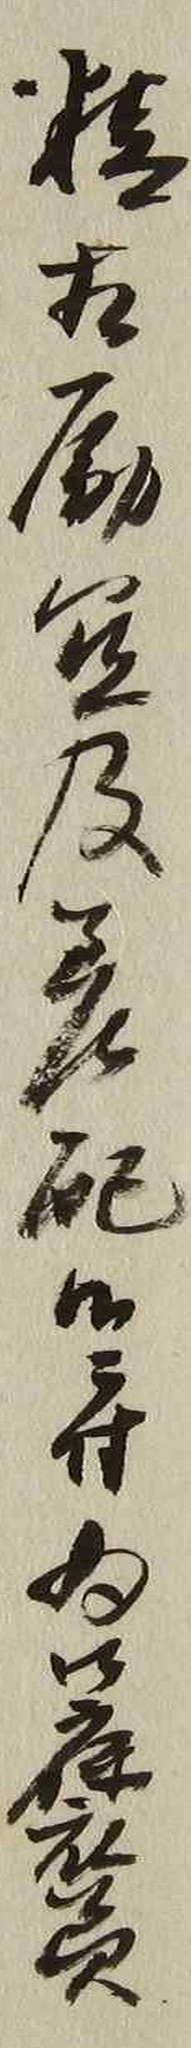精相励宜及差配候ニ付為御褒美
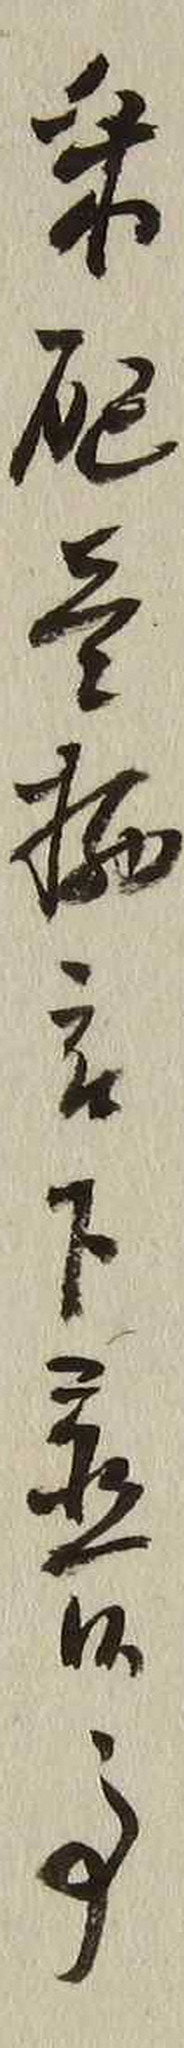采配壱柄被下置候事
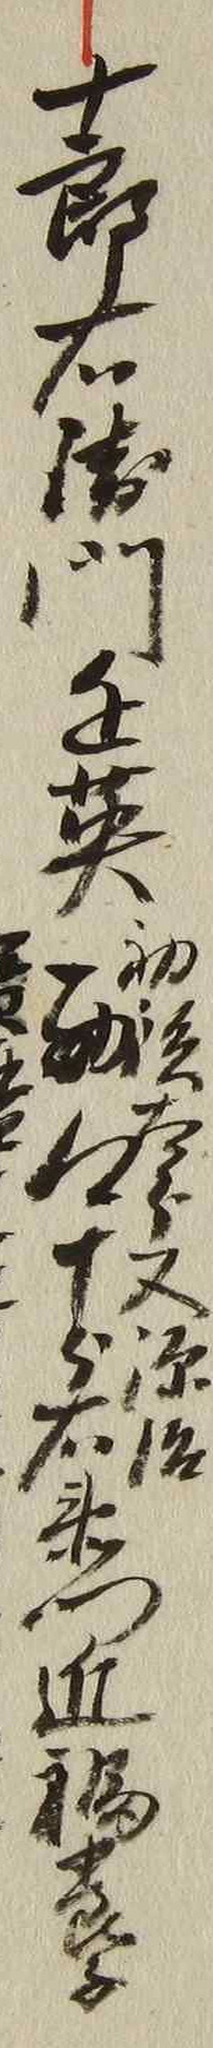十郎右衛門近英西郷十郎右衛門近福養子
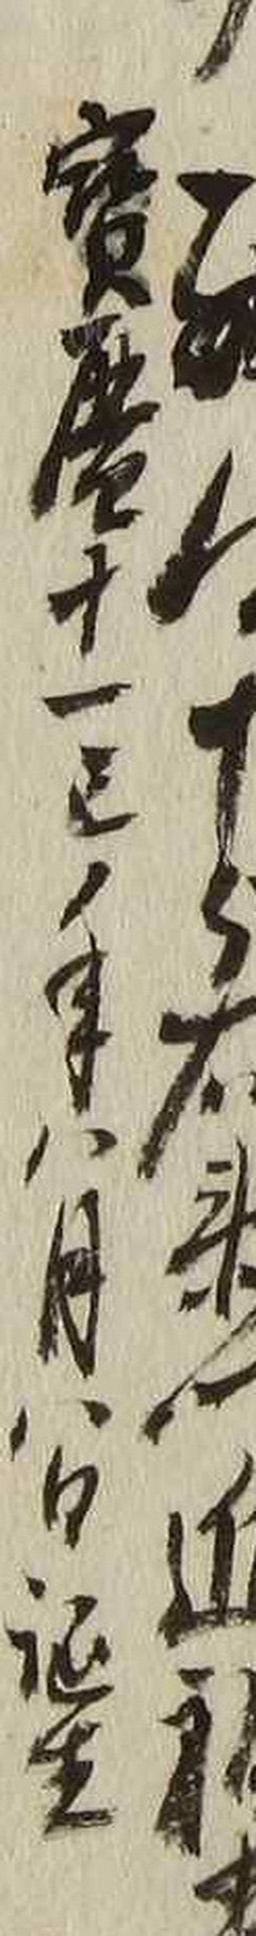宝暦十一巳年八月八日誕生
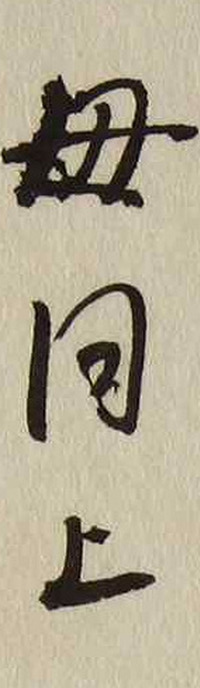母同上
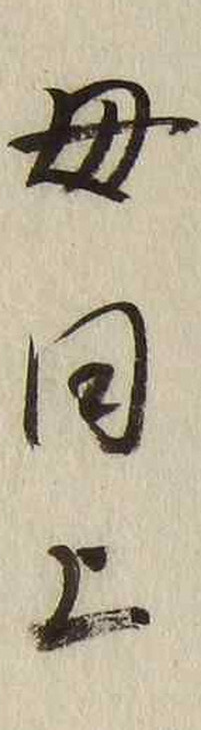母同上

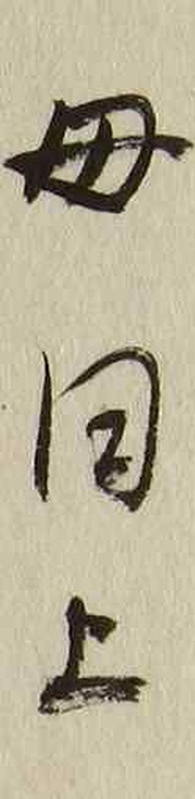母同上
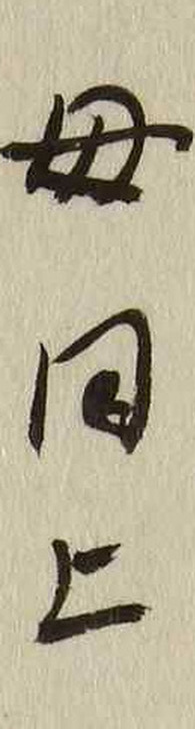母同上
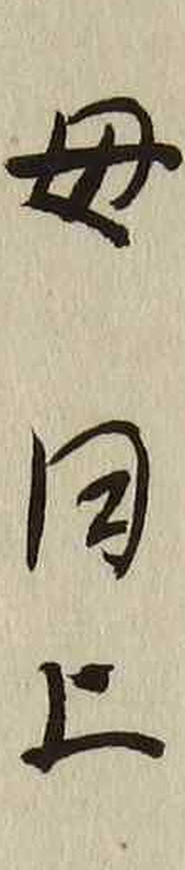母同上
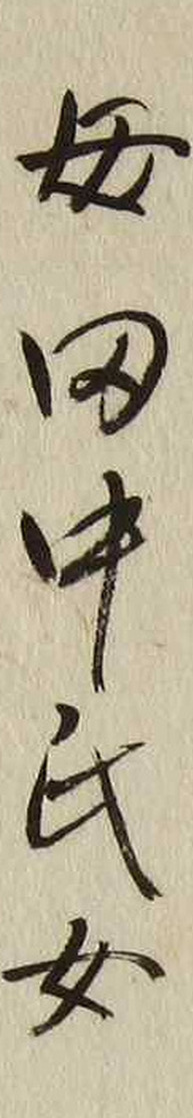母田中氏女
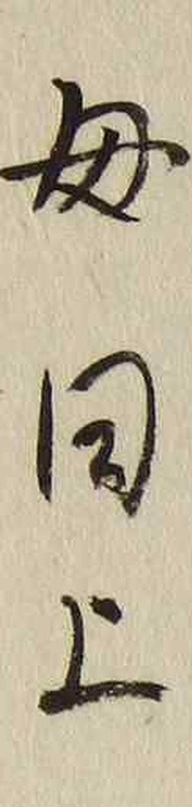母同上

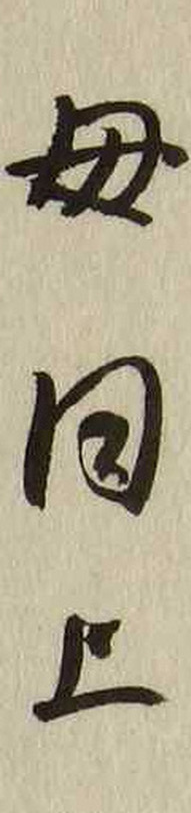母同上
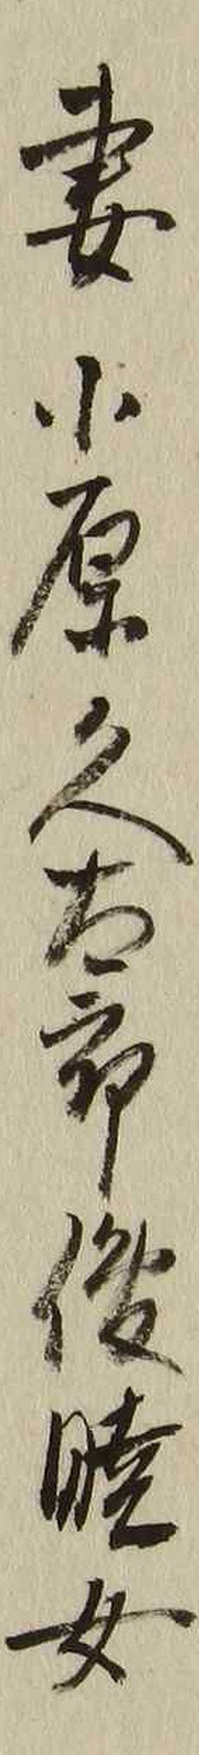妻小原久太郎俊睦女
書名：諸士系譜　巻之355　す之部5
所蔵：会津若松市立会津図書館
